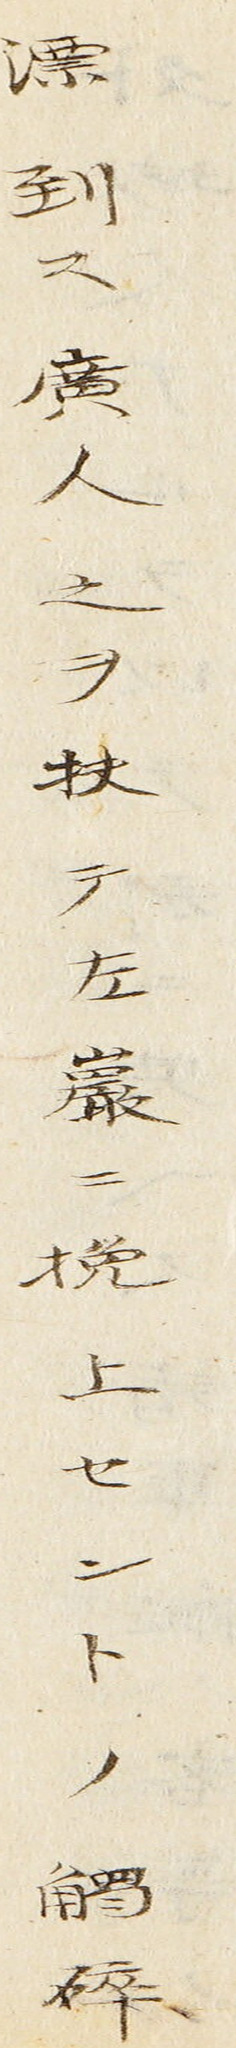漂到ス広人之ヲ扶テ左巖ニ挽上セントノ觸砕
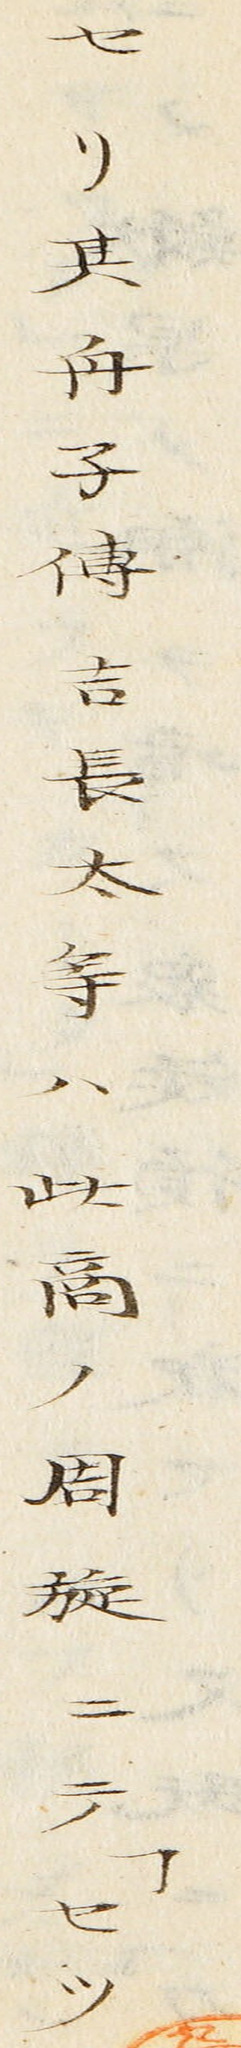セリ其舟子伝吉長太等ハ此商ノ周旋ニテ「セツ
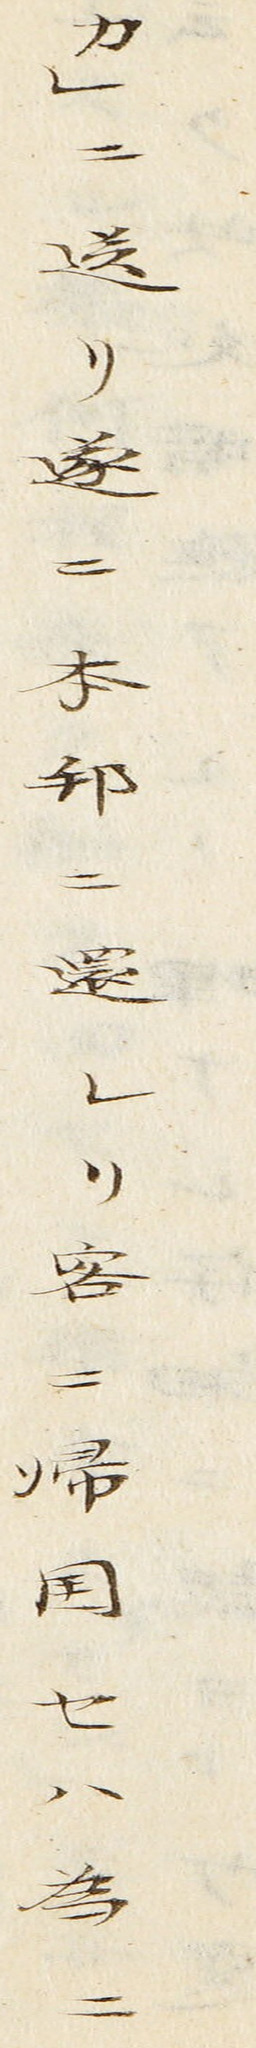カ」ニ送リ遂ニ本邦ニ還レリ客ニ帰国セハ為ニ
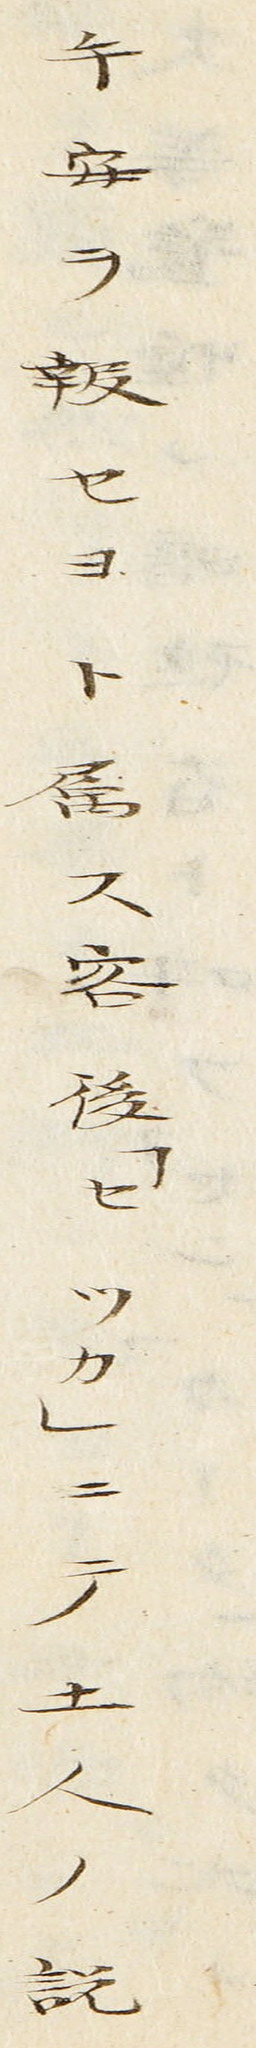午安ヲ報セヨト属ス客後「セツカ」ニテ土人ノ説
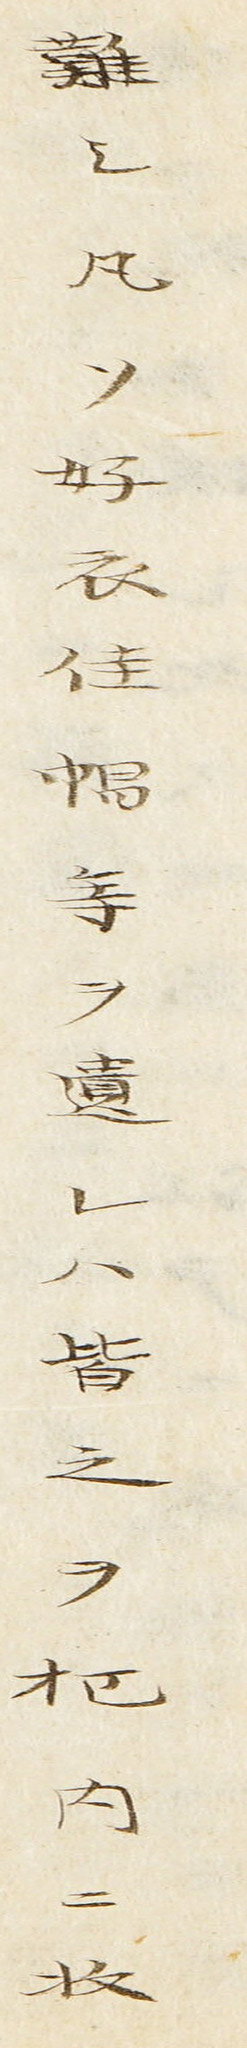難シ凡ソ好衣佳帽等ヲ遺レハ皆之ヲ内ニ収
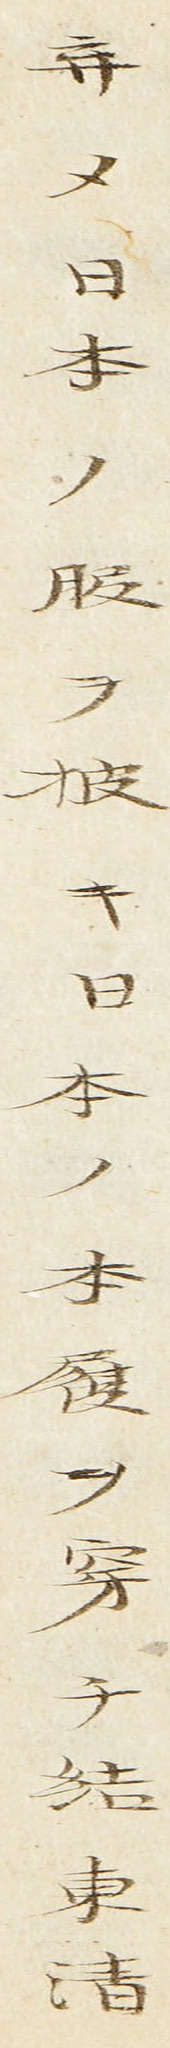弃シテ日本ノ服ヲ披キ日本ノ本履ヲ穿チ結東清
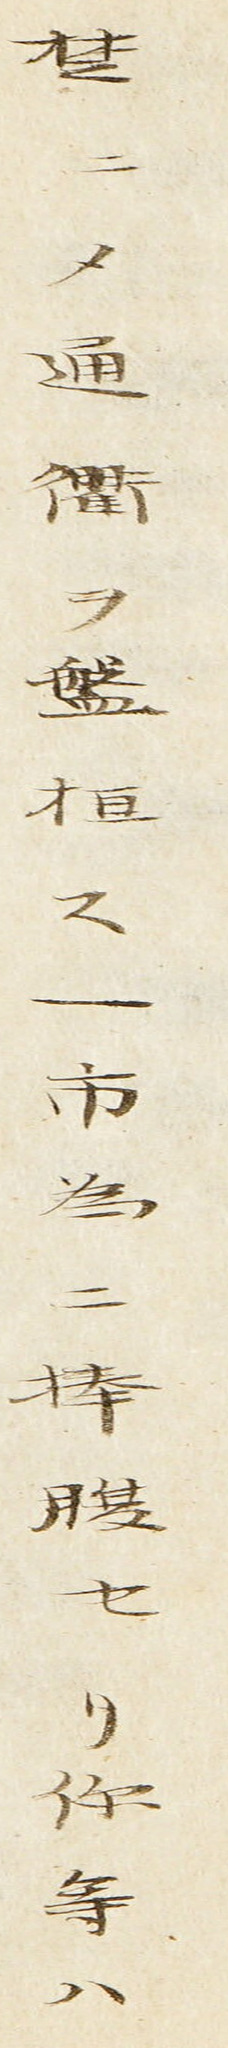楚ニシテ通衢ヲ盤桓ス一市為ニ捧腹セリ你等ハ
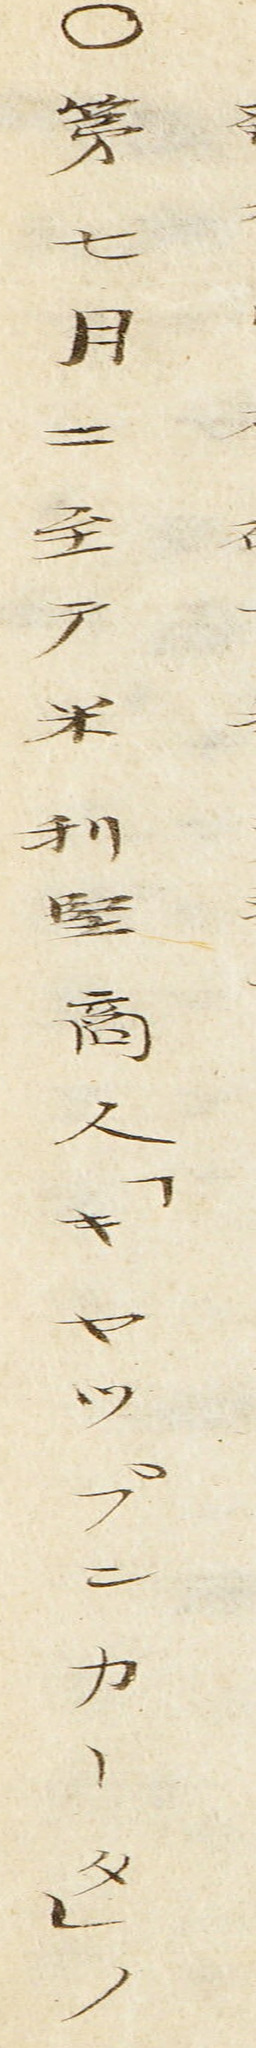○第七月ニ至テ米利堅商人「キヤツプンカータ」ノ

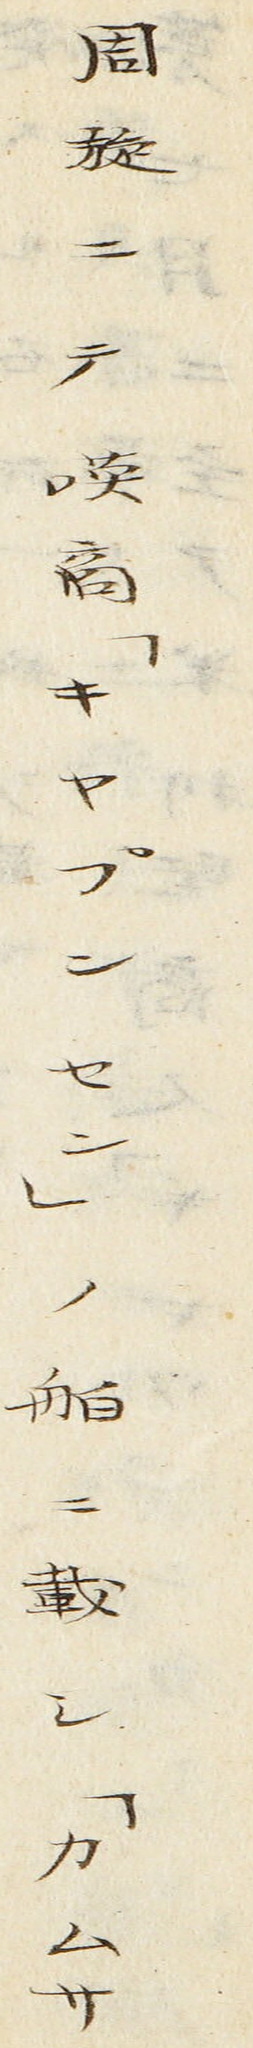周旋ニテ𠸄商「キヤプンセン」ノ舶ニ載シ「カムサ
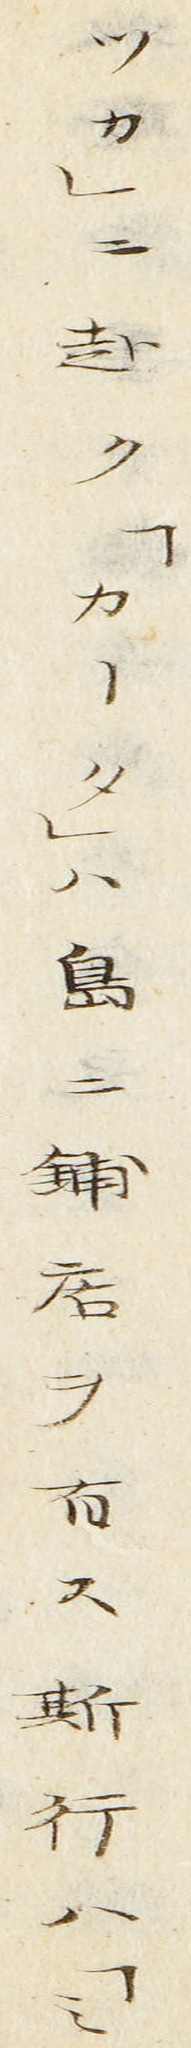ツカ」ニ赴ク「カータ」ハ島ニ鋪店ヲ有ス斯行ハ「ミ
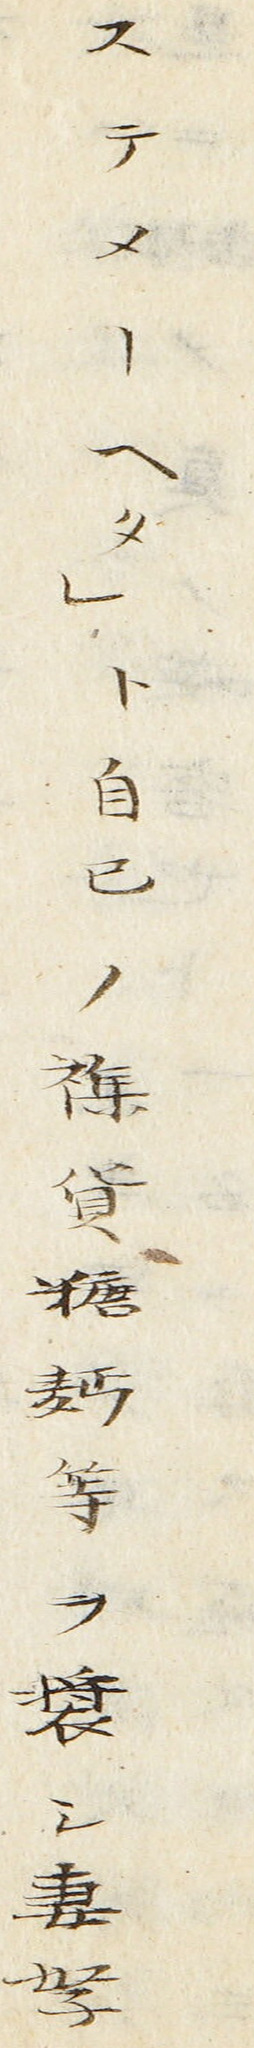ステメーヘタ」ト自己ノ襍貸糖麪等ヲ𫌏シ妻孥
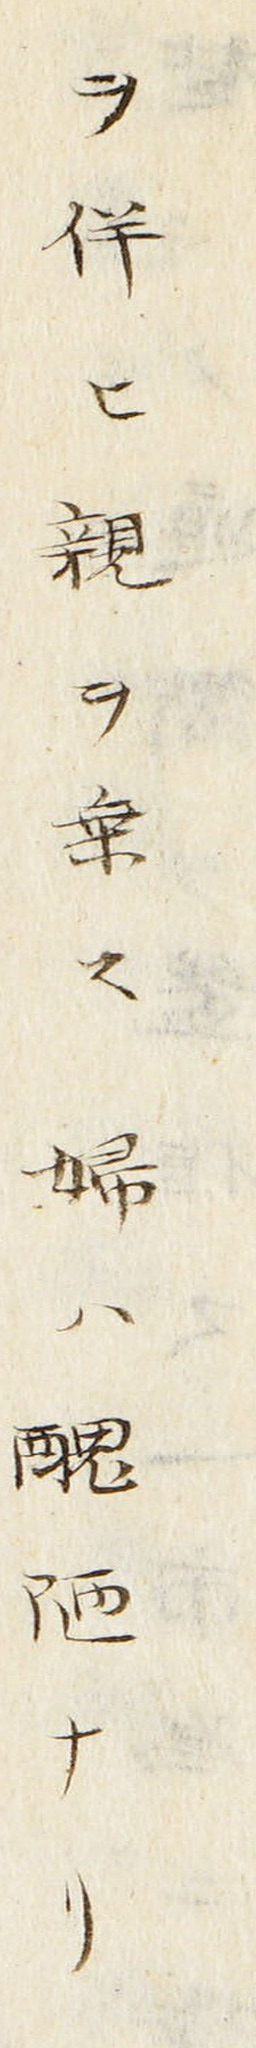ヲ伴ヒ親ラ乗ス婦ハ醜陋ナリ
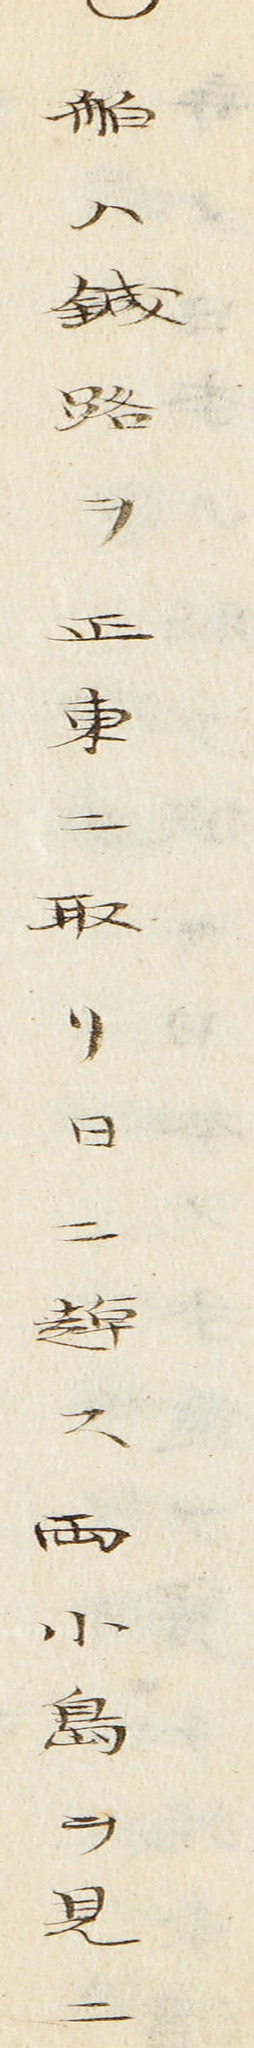○舶ハ鍼路ヲ正東ニ取リ日ニ趠ス両小島ヲ見ニ
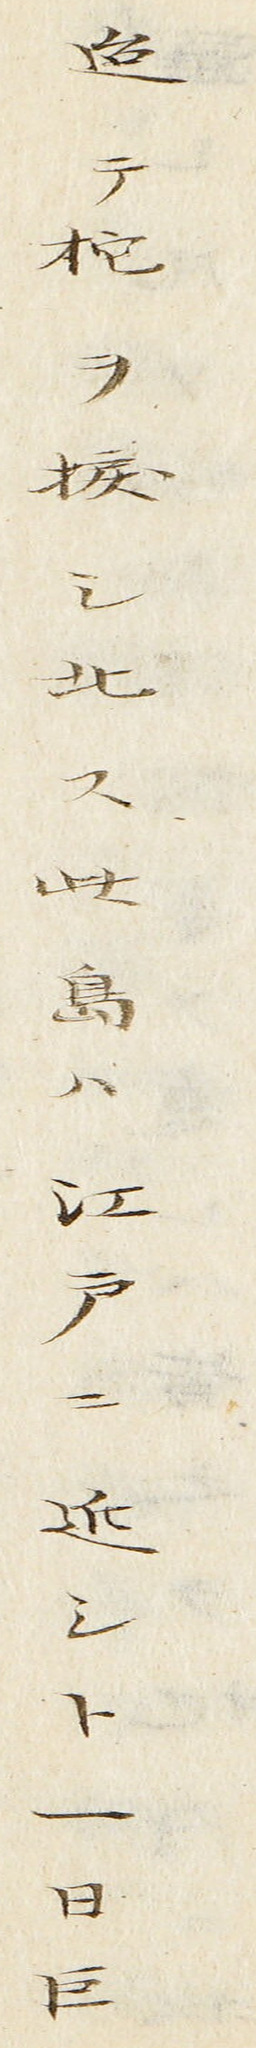迨テ柁ヲ捩シ北ス此島ハ江戸ニ近シト一日巨
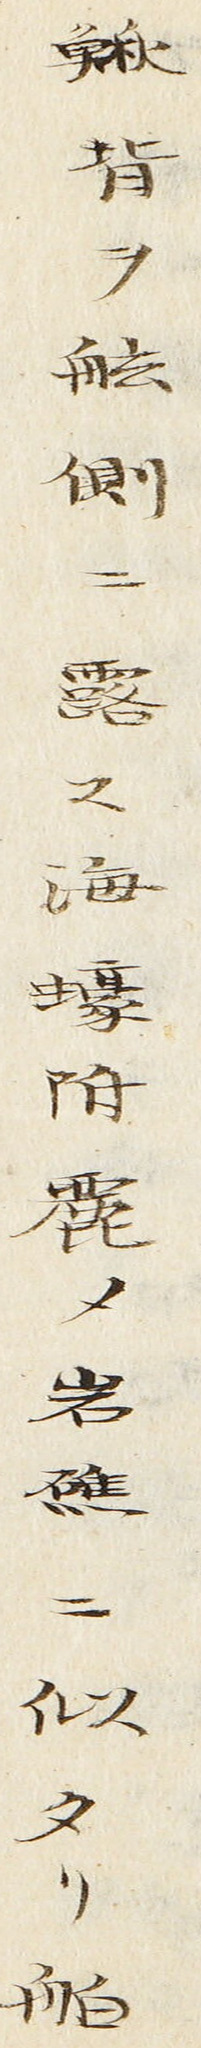鰍背ヲ舷側ニ露ス海蠔附麗して岩礁ニ似タリ舶
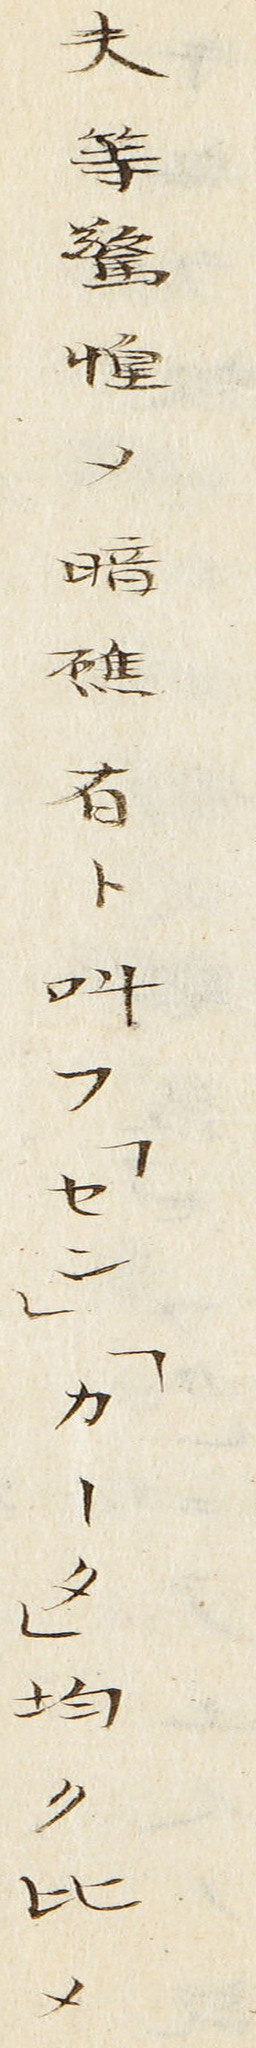夫等驚惶して暗礁有ト叫フ「セン」「カータ」均ク比シテ
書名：流蕃通書
